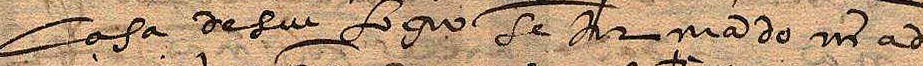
Casa de seu sogro s̄e ter mādo nē ad
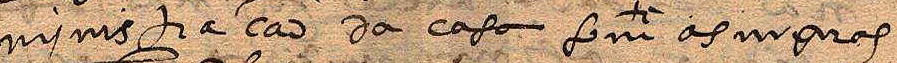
mjnistração da casa somte as negras
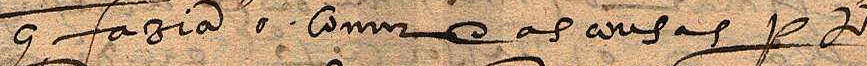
q̄ faziā o comer e as cousas ꝑtē
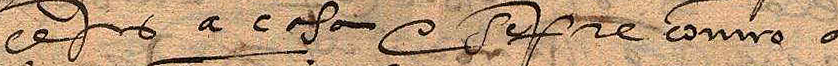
çētes a casa e s̄epre comeo a
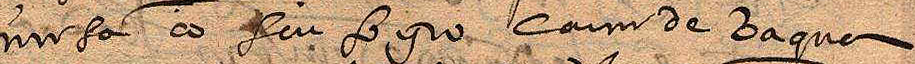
mesa c̄o seu sogro carne de vaqua
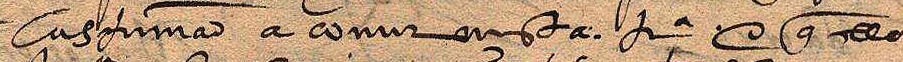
Custumão comer nesta tra e q̄ ella
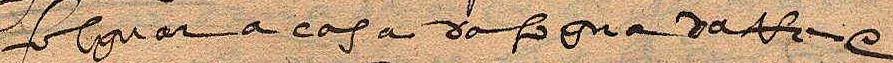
folguar a casa da sogra da Re e
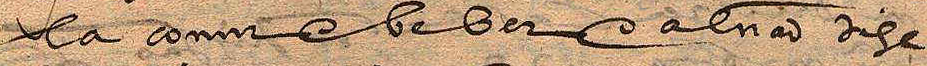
la comer e beber e al não dise
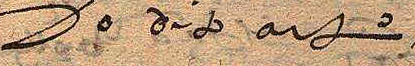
Do dito arto
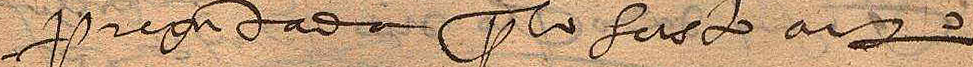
Pregūtada p̄lo seisto arto
